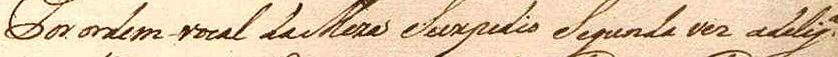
Por ordem vocal da Meza Se expedio Segunda vez a delig.a
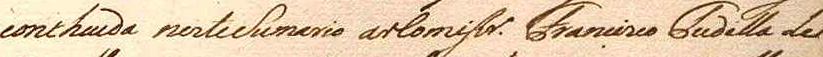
contheuda neste Sumario ao Comissr.o Françizco Tudella de
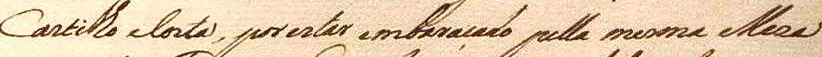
Castilho e Costa, por estar embaraçado pella mesma Meza
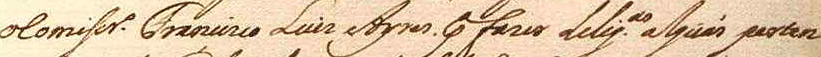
o Comissr.o Francisco Luis Ayres p.a fazer delig.as alguās perten
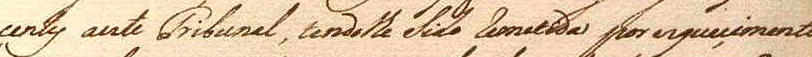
çentes a este Tribunal, tendolhe Sido Remetida por esqueçimento
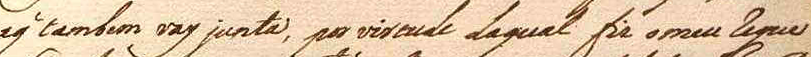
a q̄ tambem vay junta, por virtude da qual fiz o meu Reque
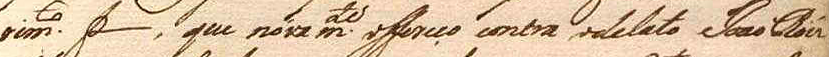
rim.to f , que novam.te offereço contra o delato Ioao Roiz̄
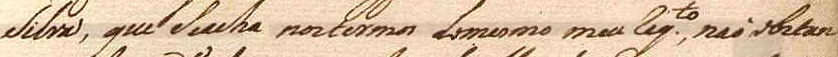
Silva, que Se acha nos termos do mesmo meu Req.to, naõ obstan
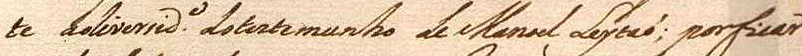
te a diversid.e do testemunho de Manoel Leytaõ; por ficar
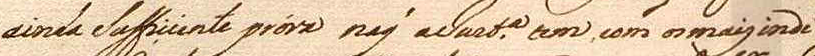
ainda Suffiçiente próva na q̄ a Iust.a tem, com os mais indi
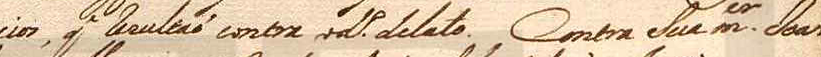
çios, q̄ Rezultaõ contra o d.o delato. Contra Sua m.er Ioan
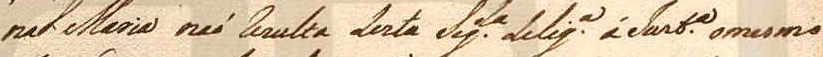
na Maria naõ Rezulta desta Seg.da delig.a á Just.a o mesmo
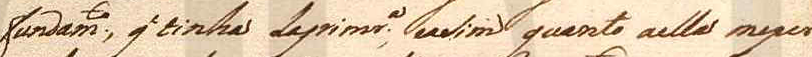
fundam.to q̄ tinha da primr.a e asim quanto a ellas me per
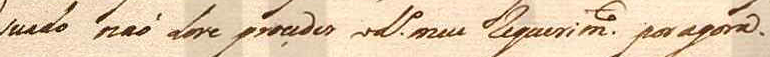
suado naõ deve proçeder o d.o meu Requerim.to por agora.
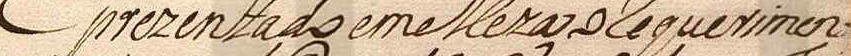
E prezentado em Meza o Requerimen
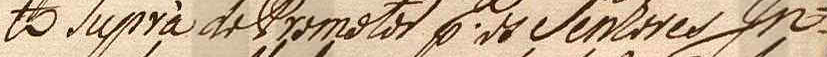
to supra do Promotor p.a os Senhores Jn
